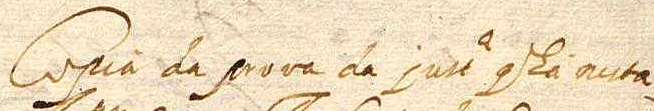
Copia da prova da justa q̄ há nesta
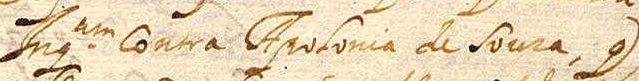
Inq.am contra Apolonia de Souza, q̄
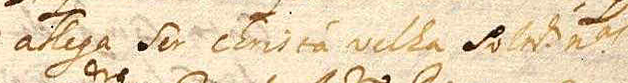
allega ser christã velha soltr.a n.al
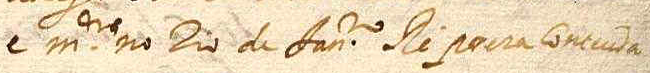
e m.ora no Rio de Ian.ro Ré preza conteuda
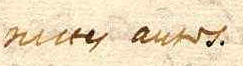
nestes autos.
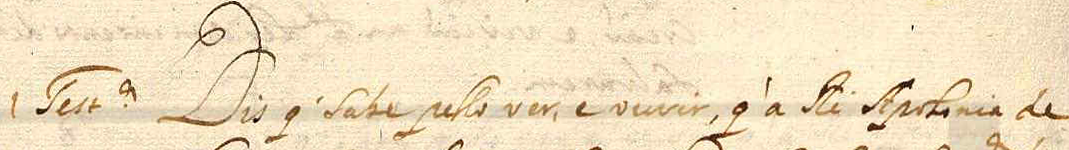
1 Test.a Dis q̄ sabe pello ver, e ouvir, q̄ a Ré Apolonia de
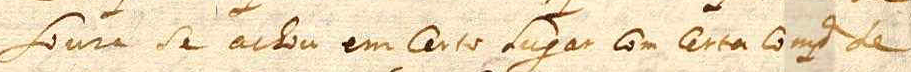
souza se achou em certo Lugar com certa compa de
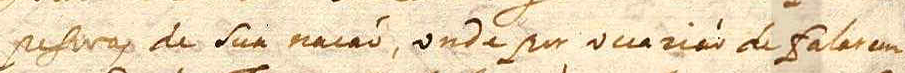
pessoas de sua naçaõ, onde por occaziaõ de falarem
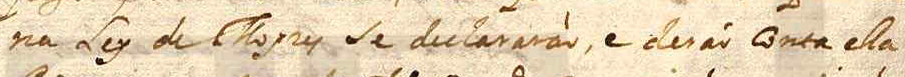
na Ley de Moyzes se declararaõ, e deraõ conta ella
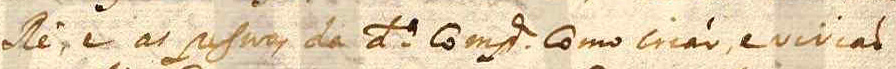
Ré, e as pessoas da d̄a comp.a como criaõ, e viviaõ
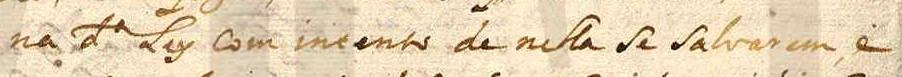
na d̄a Ley com intento de nella se salvarem, e
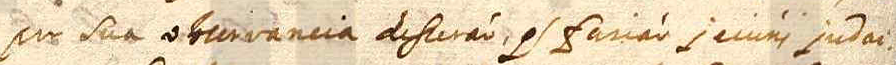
por sua observancia disseraõ, q̄ faziaõ jeiuns̄ judai
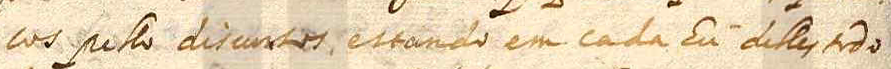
cos pello discursos, estando em cada hū delles todo
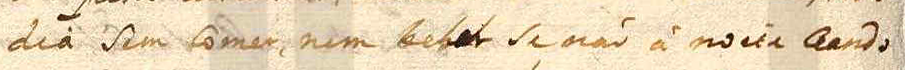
dia sem comer, nem beber senaõ á noite ceando
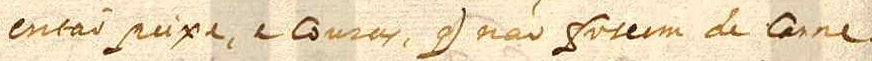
entaõ peixe, e couzas, q̄ naõ fossem de carne.
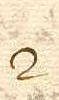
2
